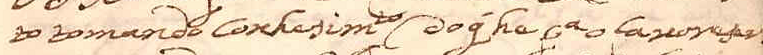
to tomando conhesimto do q̄ he pa o fauoreser
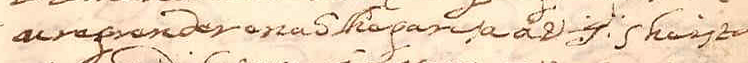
ou reprender e naõ lhe paresa a V J.S he isto
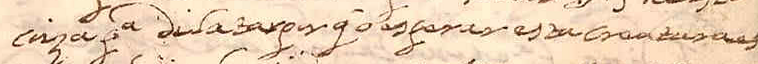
coiza pa dilatar porq̄ o esperar esta creatura es
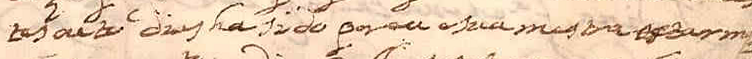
tes outo dias ha sido por eu e sua mestra estarmos
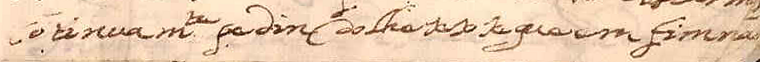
cōtinuamte pedindolhe se sosegue em fim não
